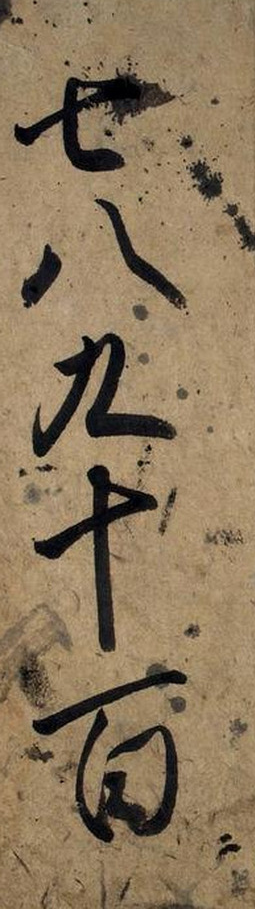七八九十百

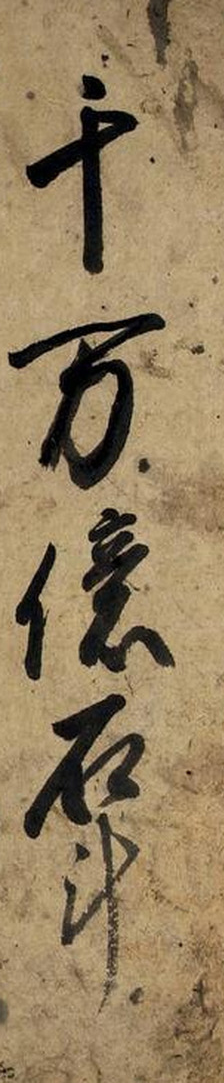千万億石斗
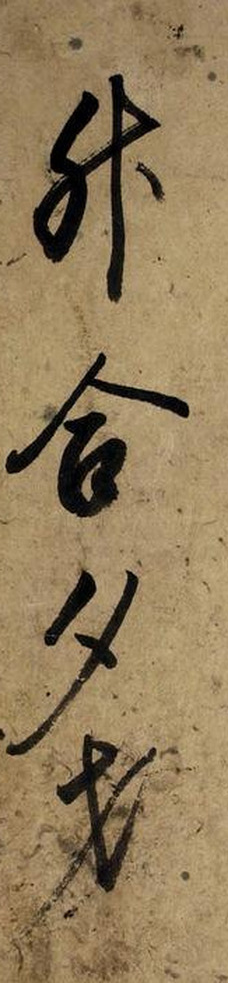升合勺才
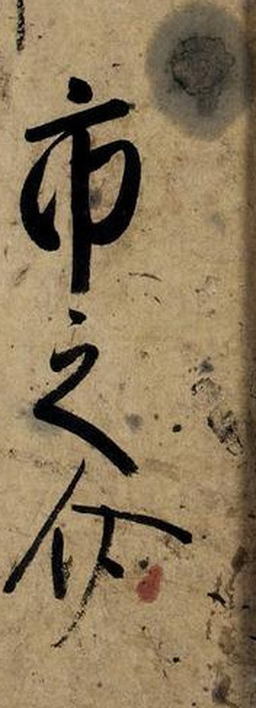市之介

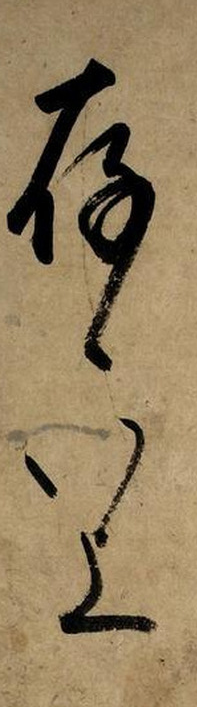存候以上
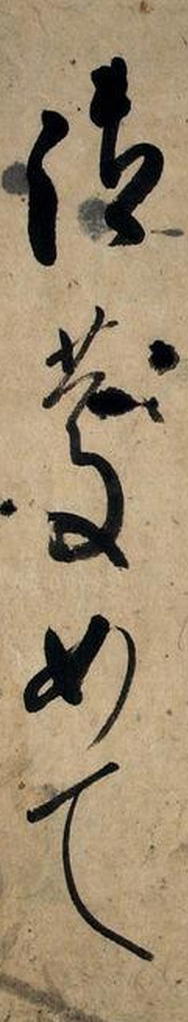御慶めて

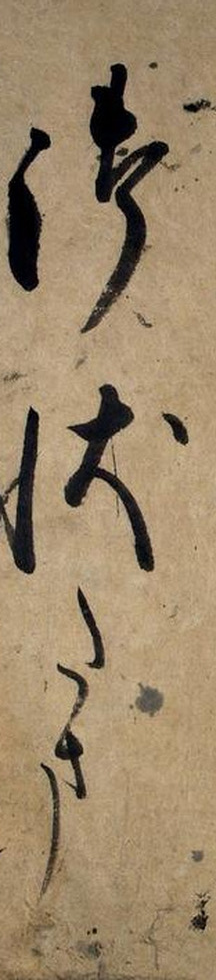御状たま

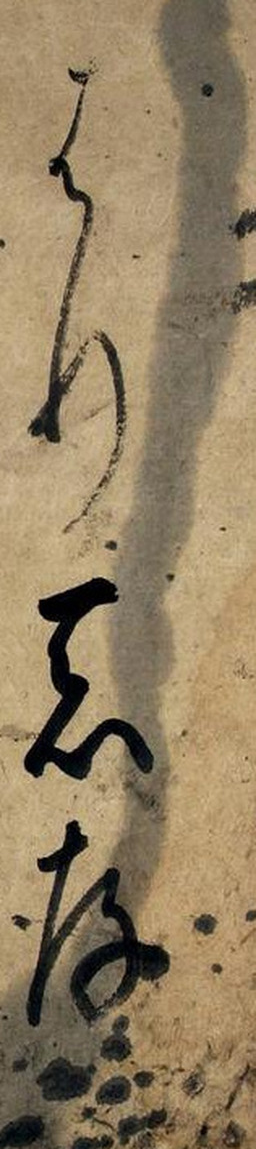はり忝存
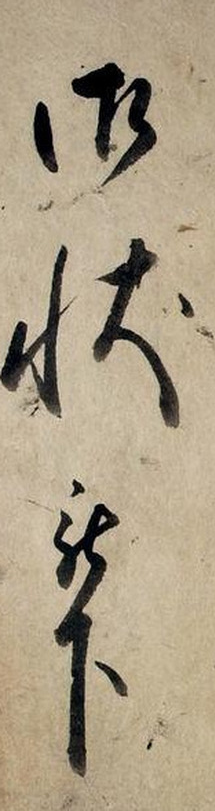御状被下

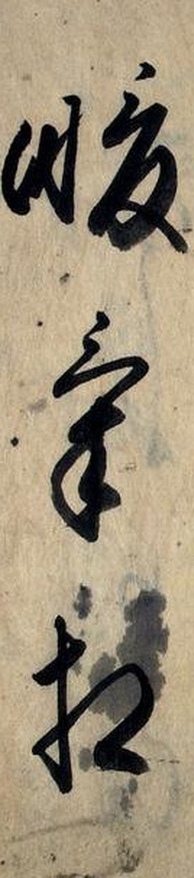暖気相

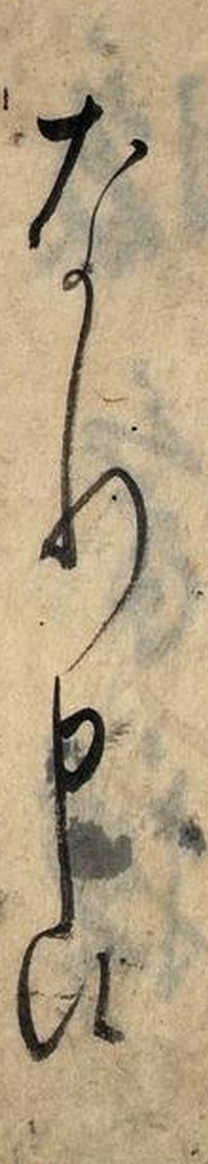なり申候
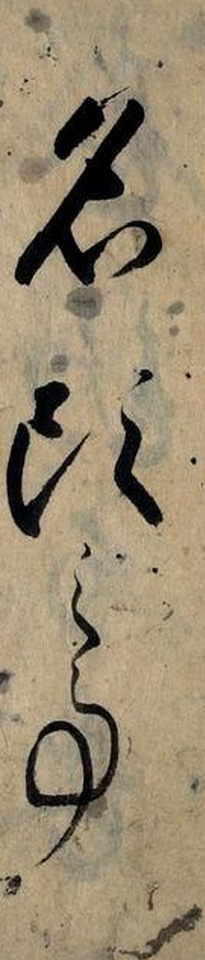名頭之事
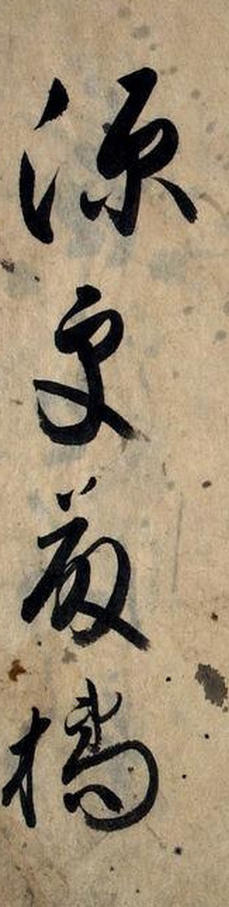源平藤橘

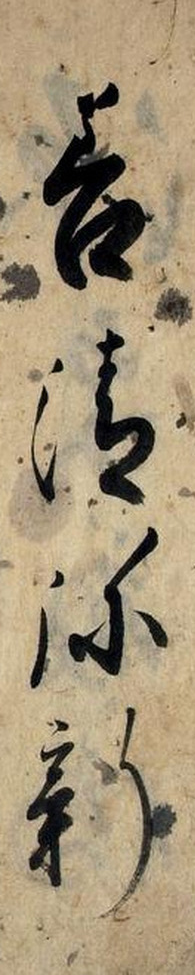善清弥新
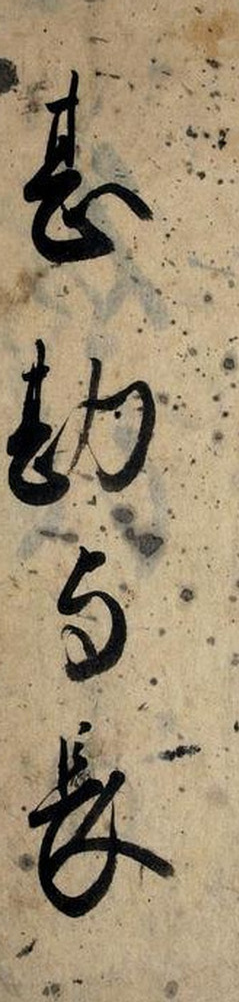甚勘与長
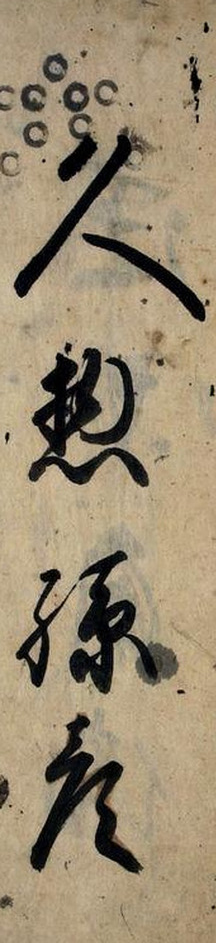久惣孫彦
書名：御手本（手習、いろは・数字、「名頭之事」「親戚字尽」「相庭之…
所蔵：福井県文書館 Fukui Prefectural Archives
